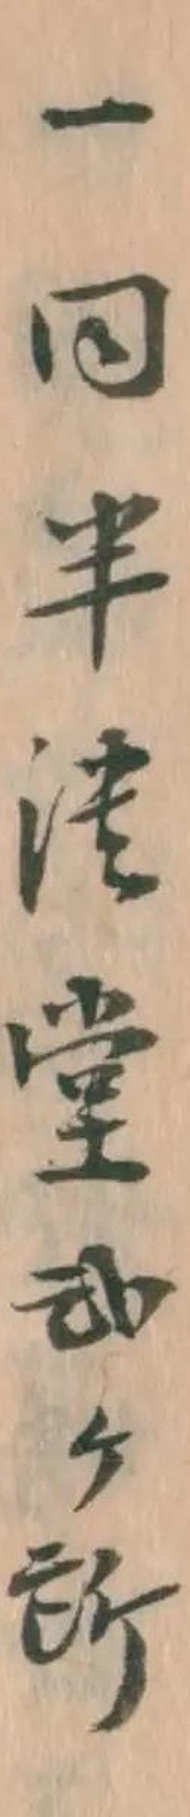一同半潰堂弐ヶ所
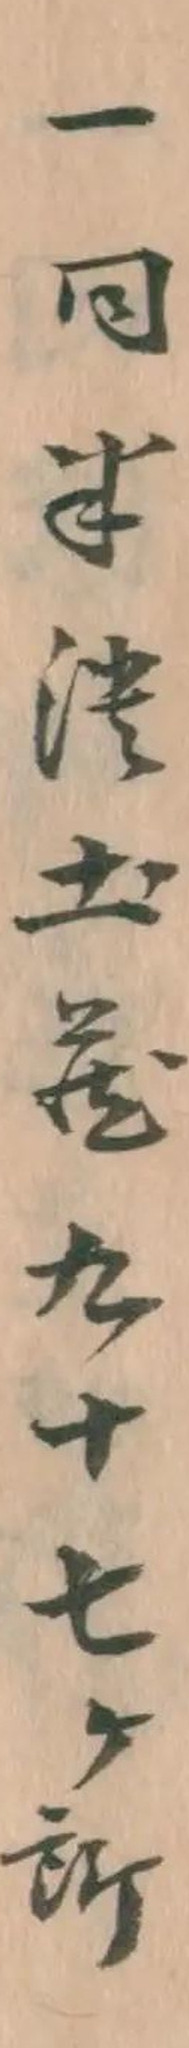一同半潰土蔵九十七ヶ所
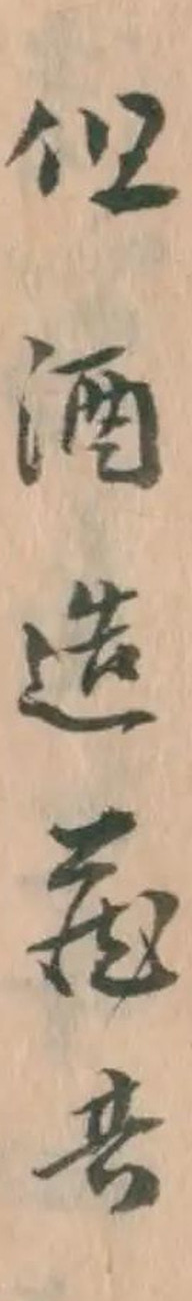但酒造蔵共

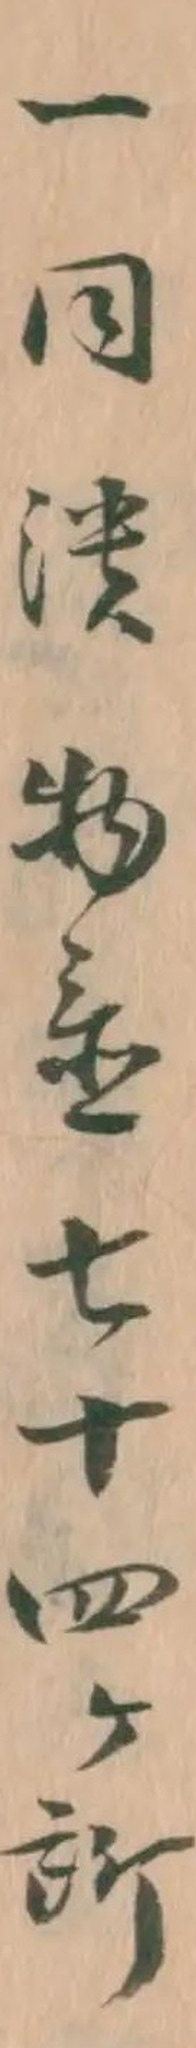一同潰物置七十四ヶ所
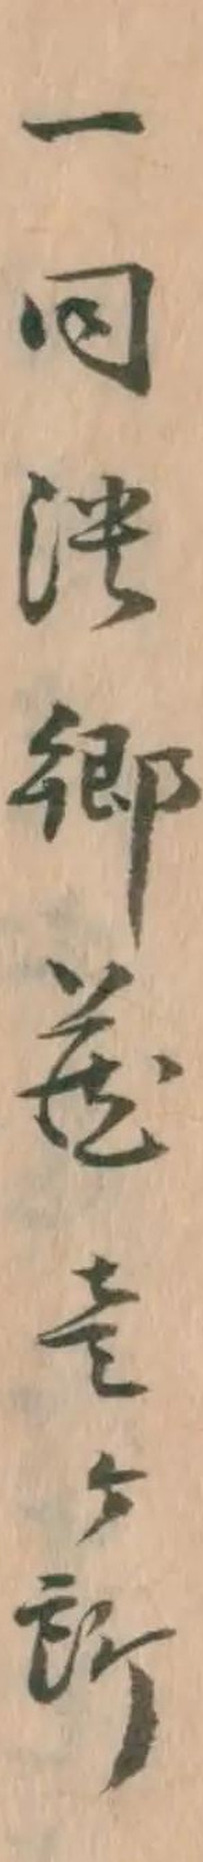一同潰郷蔵壱ヶ所
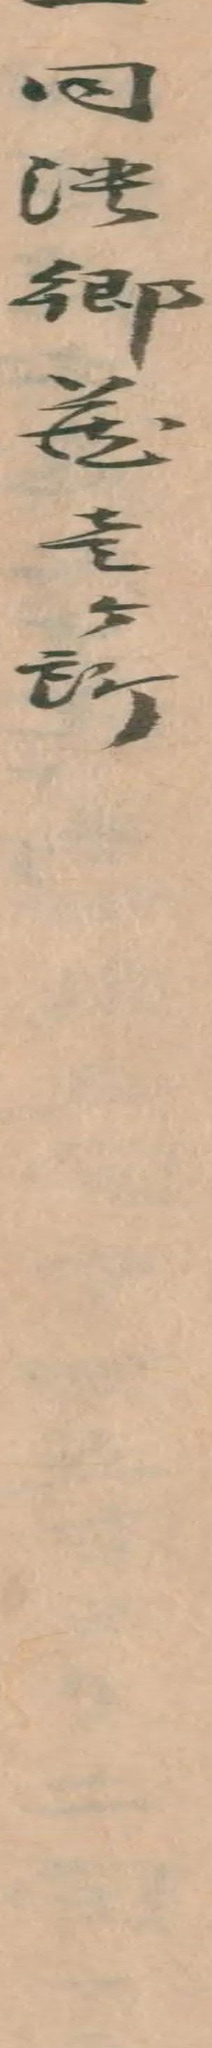一同潰郷蔵壱ヶ所
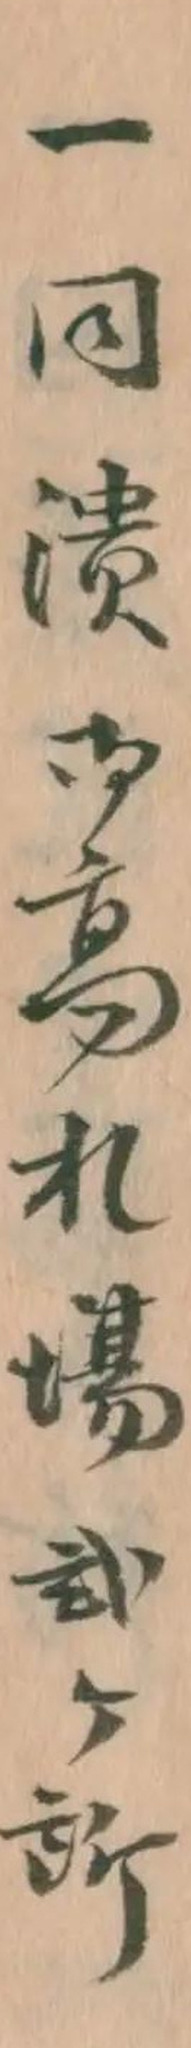一同潰御高札場弐ヶ所
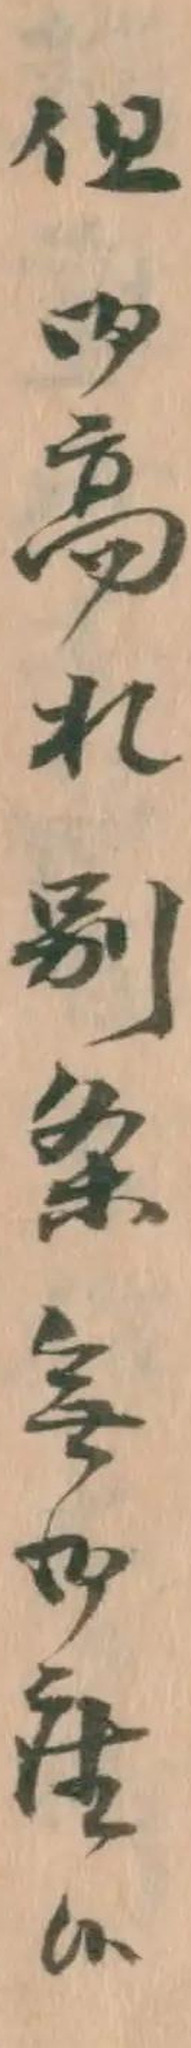但御高札別条無御座候
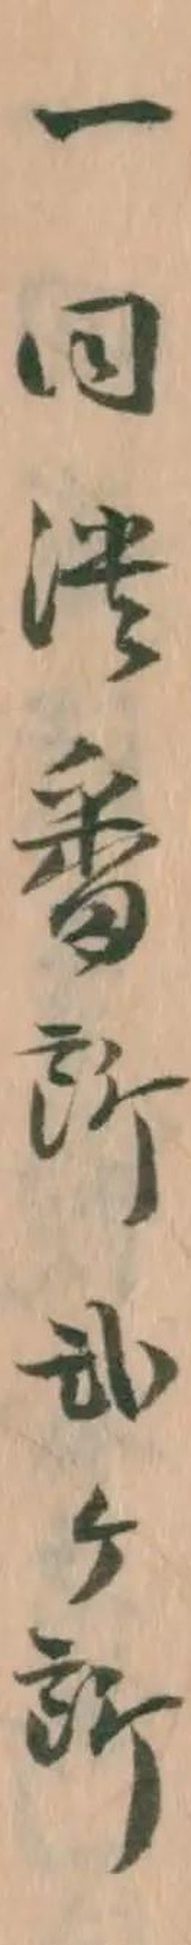一同潰番所弐ヶ所
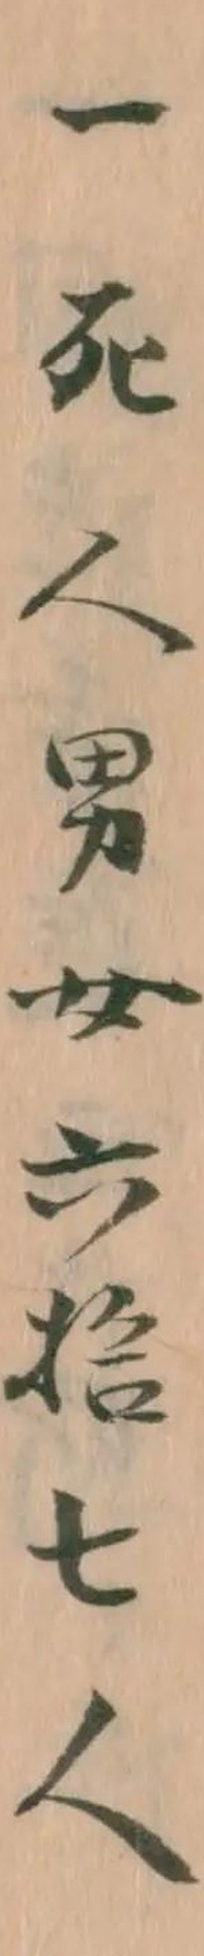一死人男女六拾七人
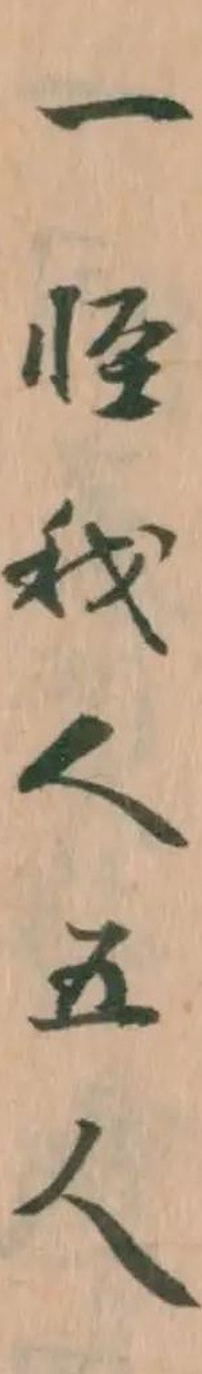一怪我人五人
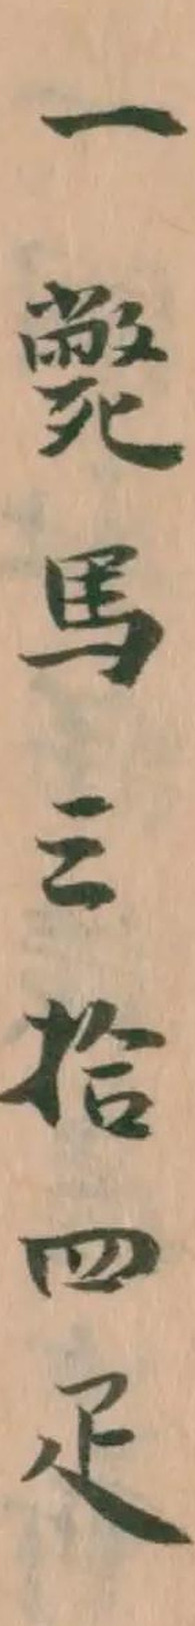一斃馬三拾四疋
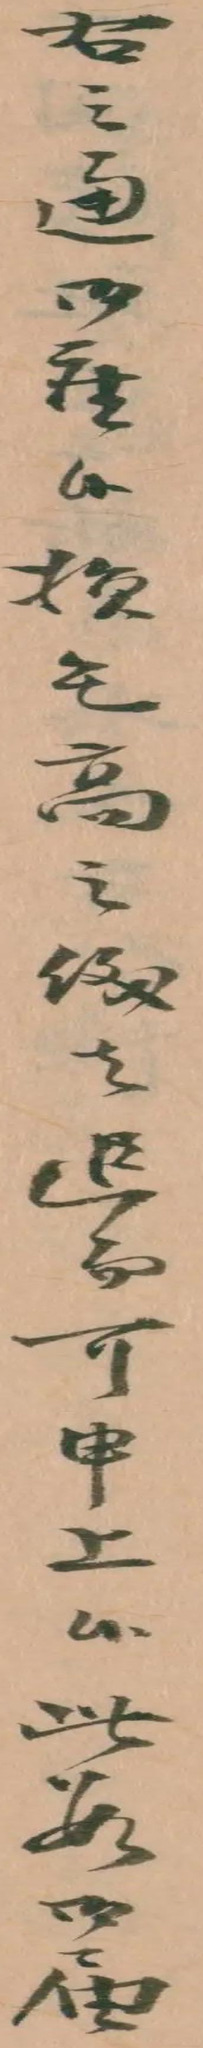右之通り御座候損毛高之儀者追而可申上候此段御届
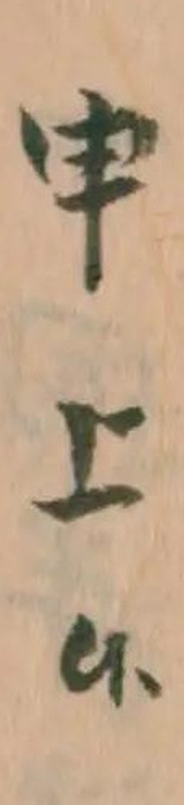申上候
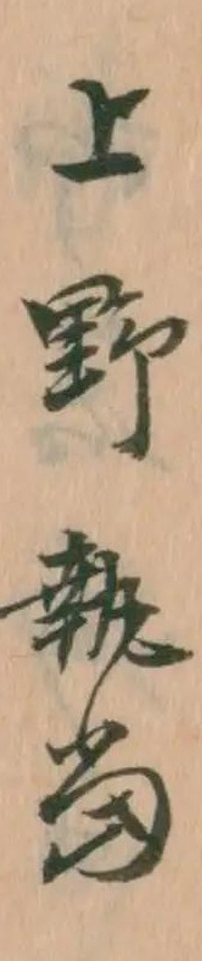上野執当
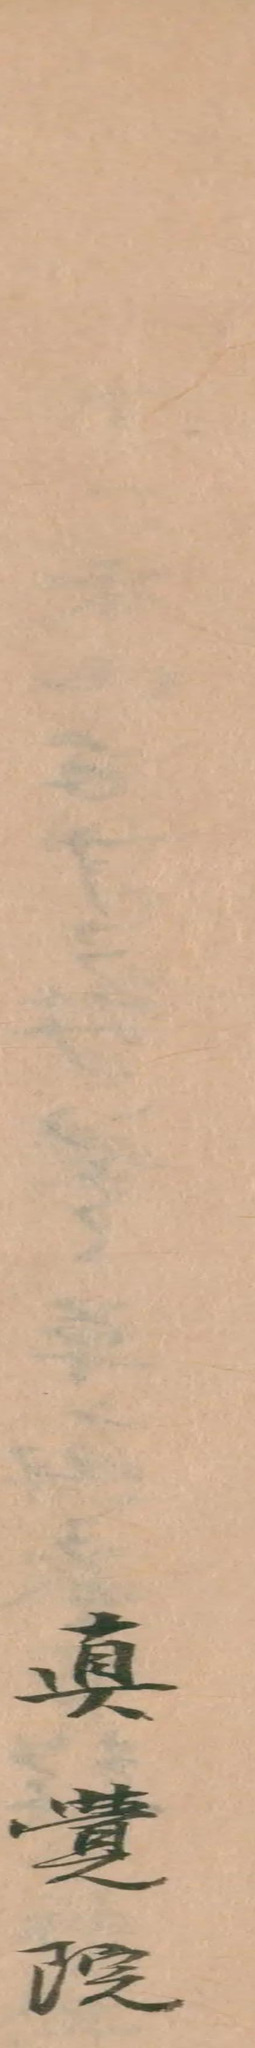真覚院
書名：地災撮要. 巻3(地震之部)-巻4(噴火之部)
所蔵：国立国会図書館 National Diet Library, JAPAN
